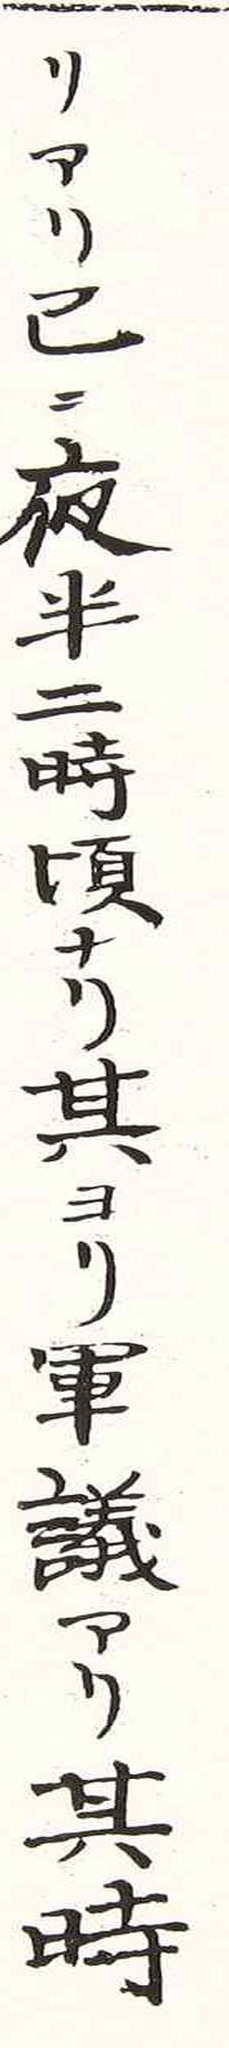リアリ已ニ夜半二時頃ナリ其ヨリ軍議アリ其時
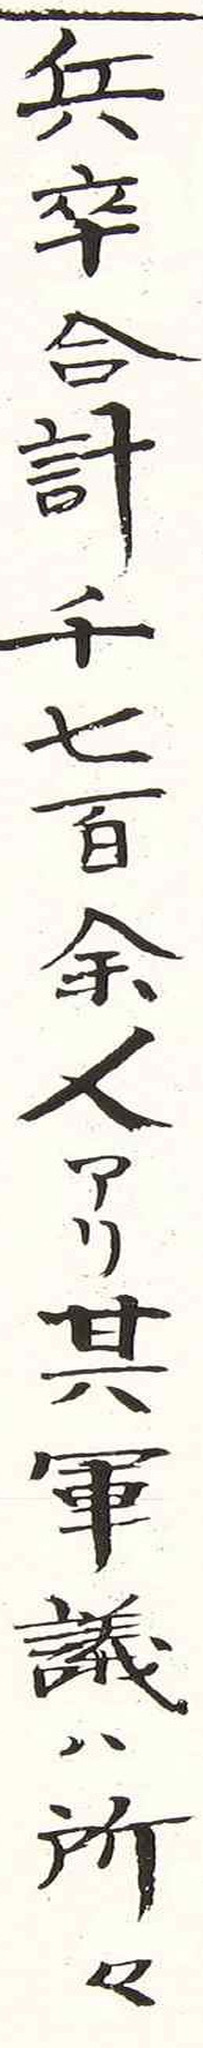兵卒合計千七百余人アリ其軍議ハ所々
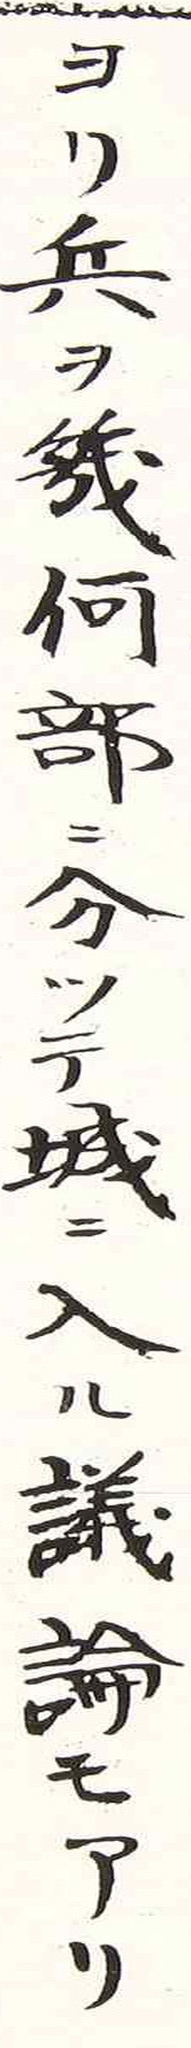ヨリ兵ヲ幾何部ニ分ツテ城ニ入ル議論モアリ
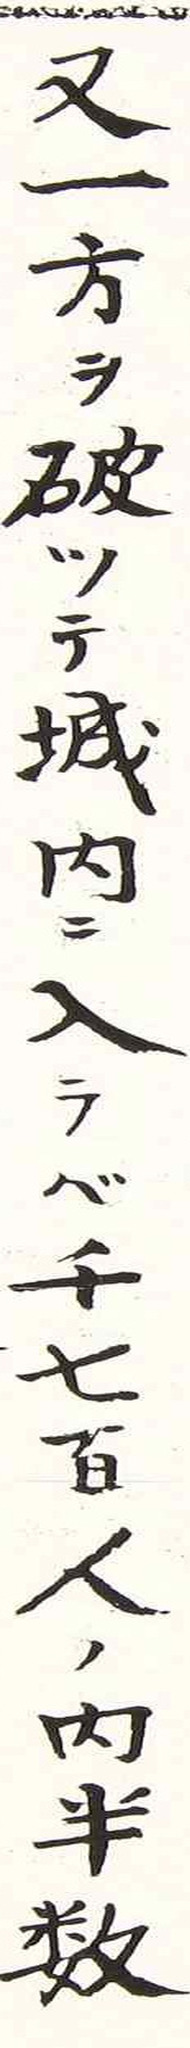又一方ヲ破ツテ城内ニ入ラバ千七百人ノ内半数
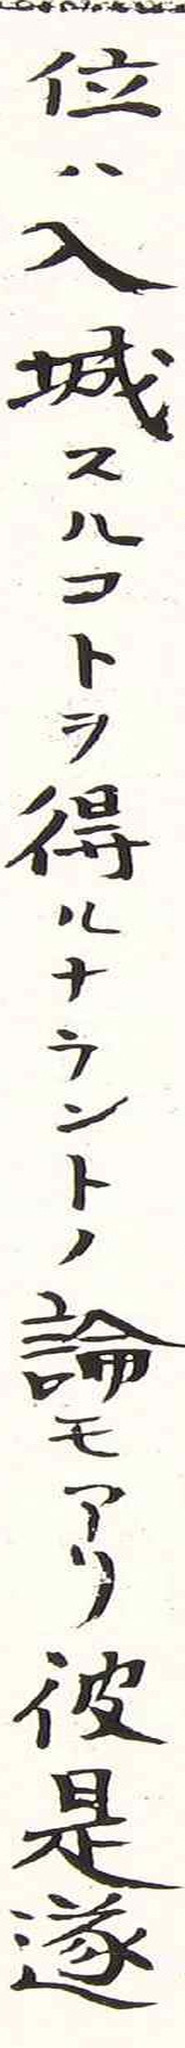位ハ入城スルコトヲ得ルナラントノ論モアリ彼是遂
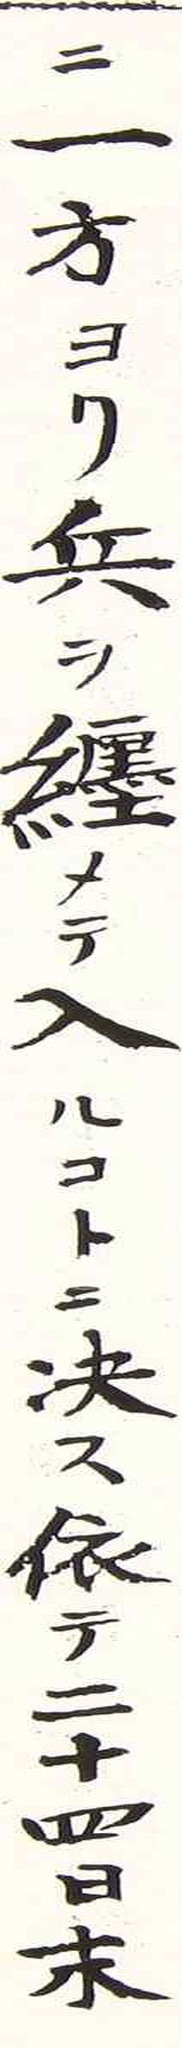ニ一方ヨリ兵ヲ纏メテ入ルコトニ決ス依テ二十四日未
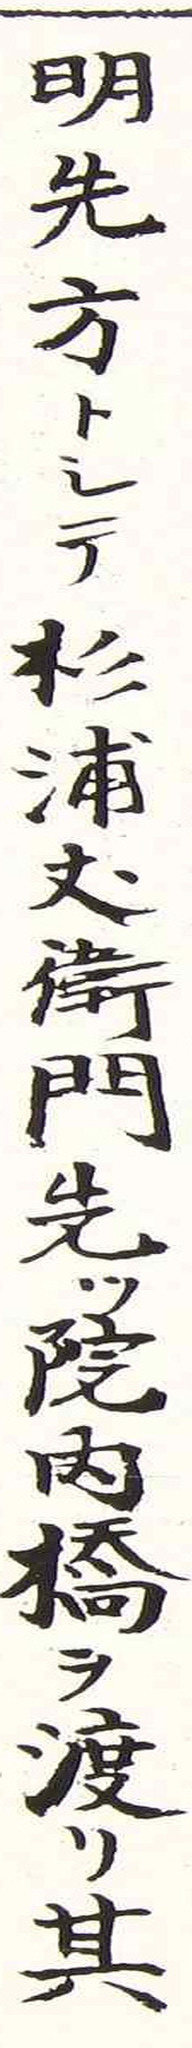明先方トシテ杉浦丈衛門先ツ院内橋ヲ渡リ其
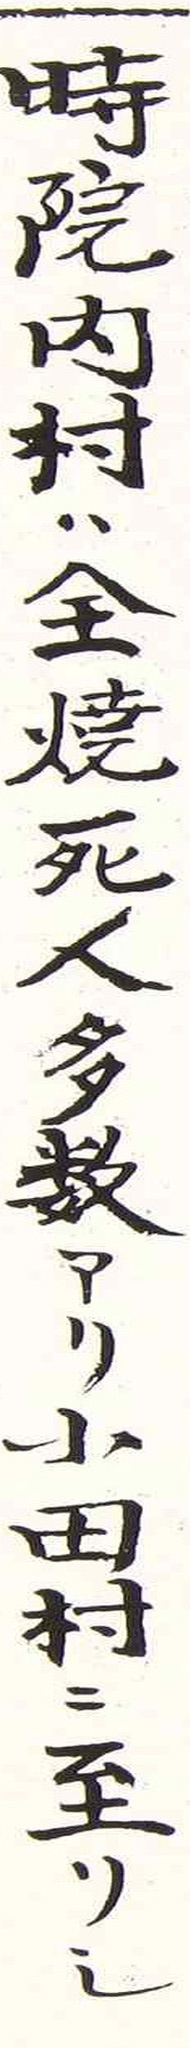時院内村ハ全焼死人多数アリ小田村ニ至リシ
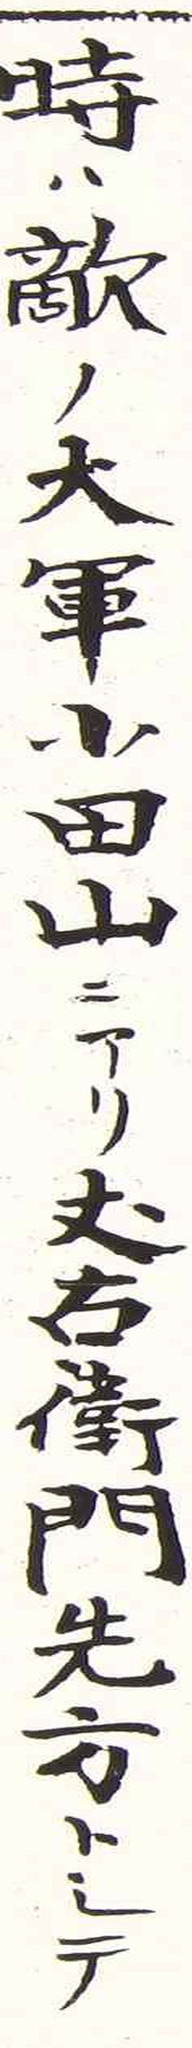時ㇵ敵ノ大軍小田山ニアリ丈右衛門先方トシテ
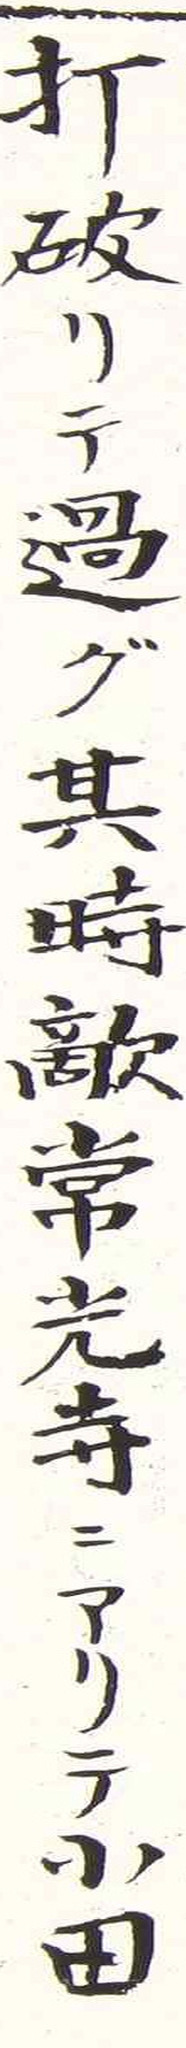打破リテ過グ其時敵常光寺ニアリテ小田

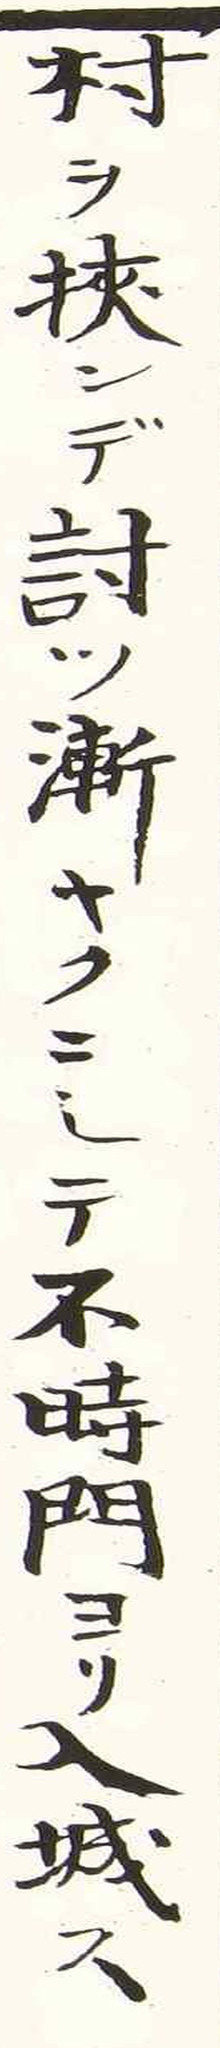村ヲ挟ンデ討ツ漸ヤクニシテ不時門ヨリ入城ス
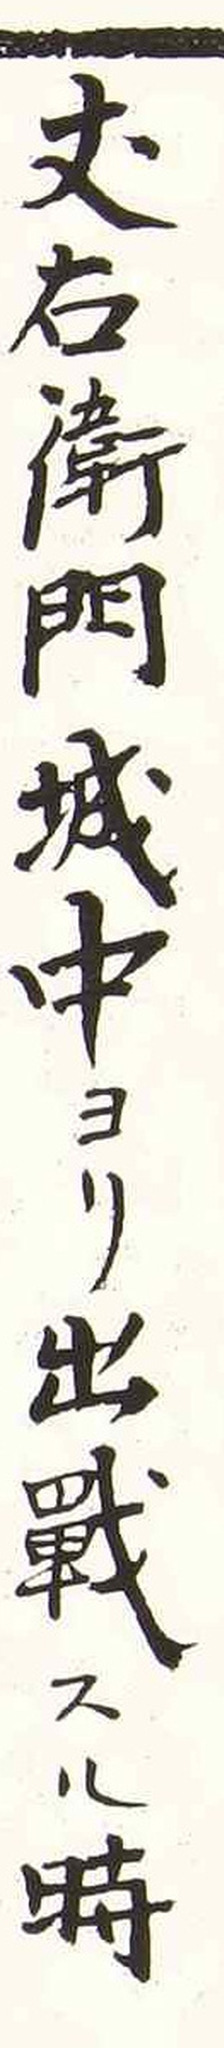丈右衛門城中ヨリ出戦スル時
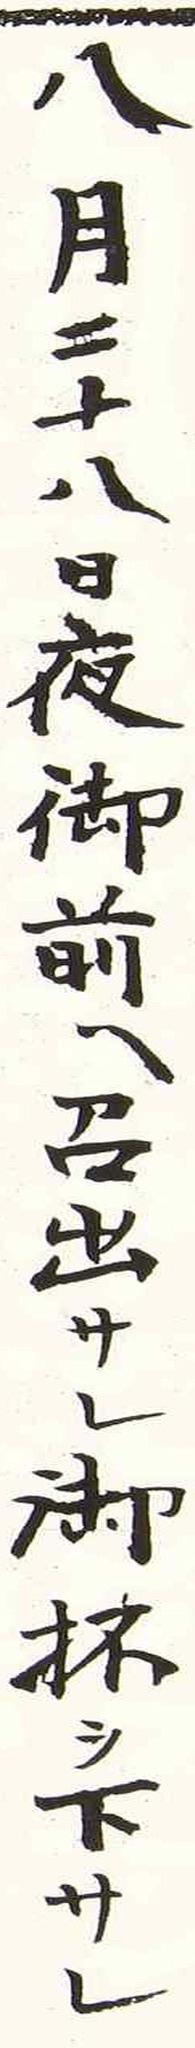八月二十八日夜御前へ召出サレ御杯ヲ下サレ
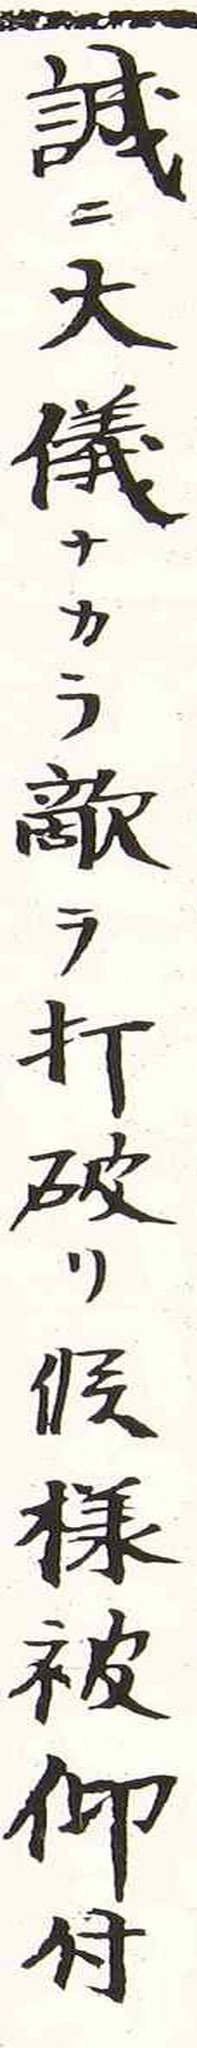誠ニ大儀ナカラ敵ヲ打破リ候様被仰付
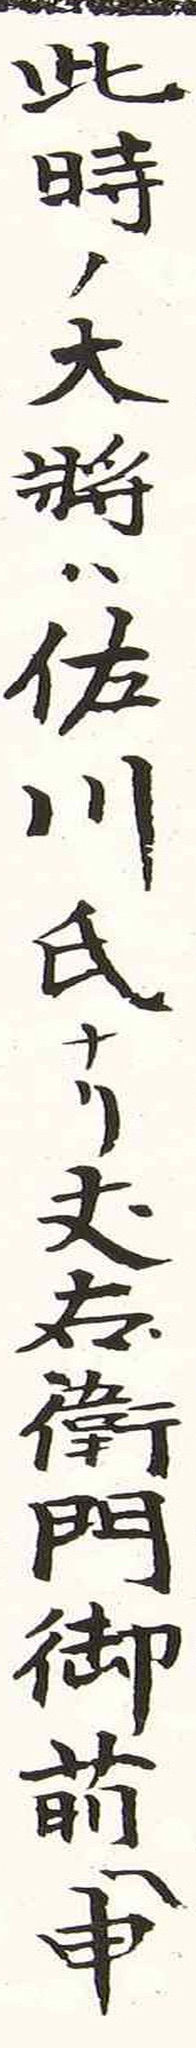此時ノ大将ハ佐川氏ナリ丈右衛門御前へ申
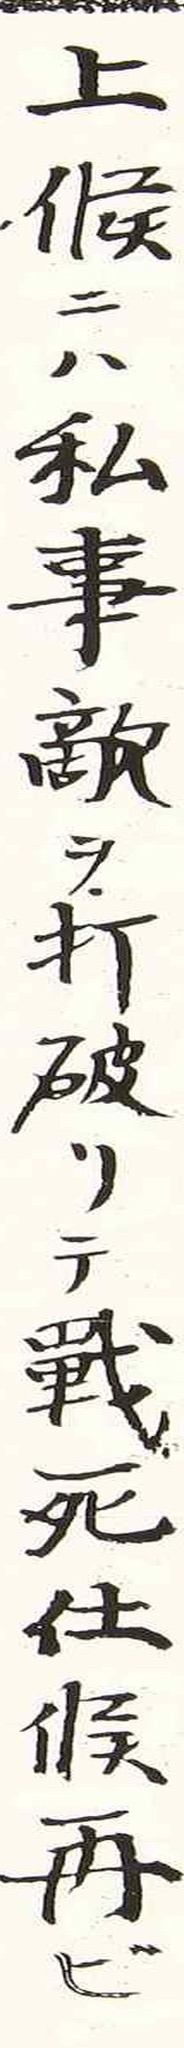上候ニハ私事敵ヲ打破リテ戦死仕候再ビ
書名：諸士系譜　巻之357　す之部7
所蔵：会津若松市立会津図書館
